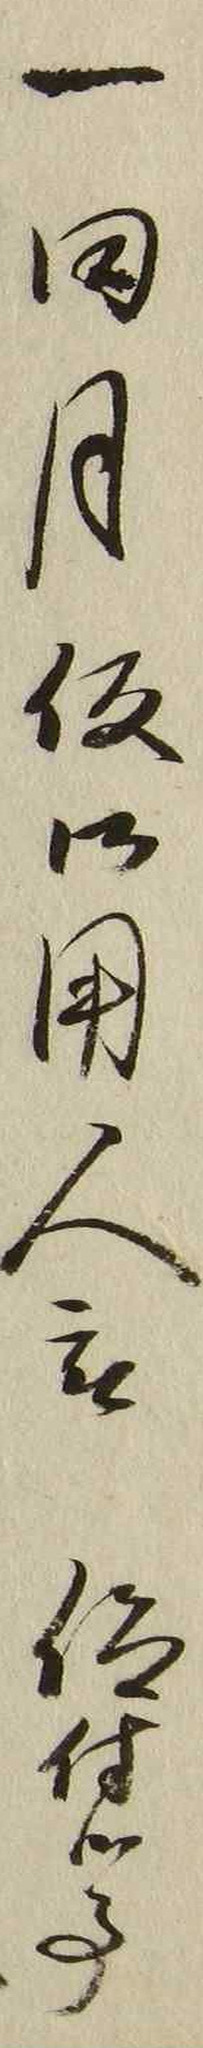一同月仮御用人被仰付候事
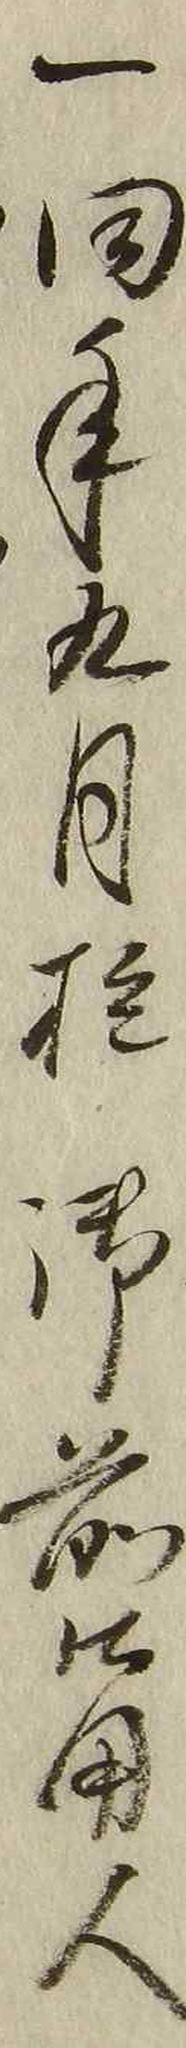一同年九月於御前御用人
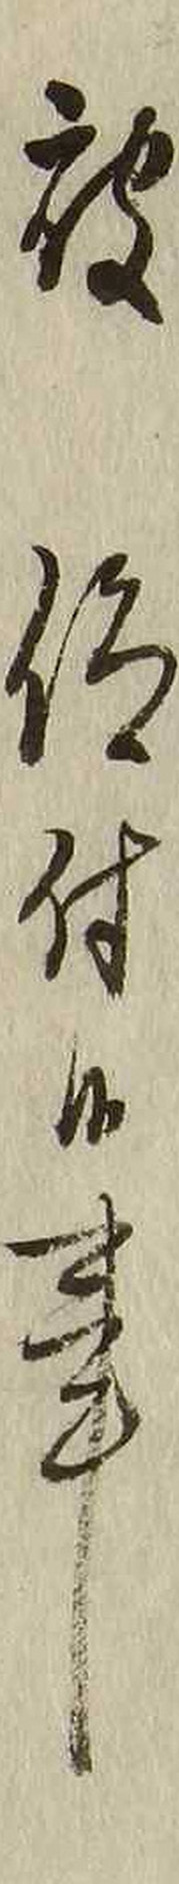被仰付候事
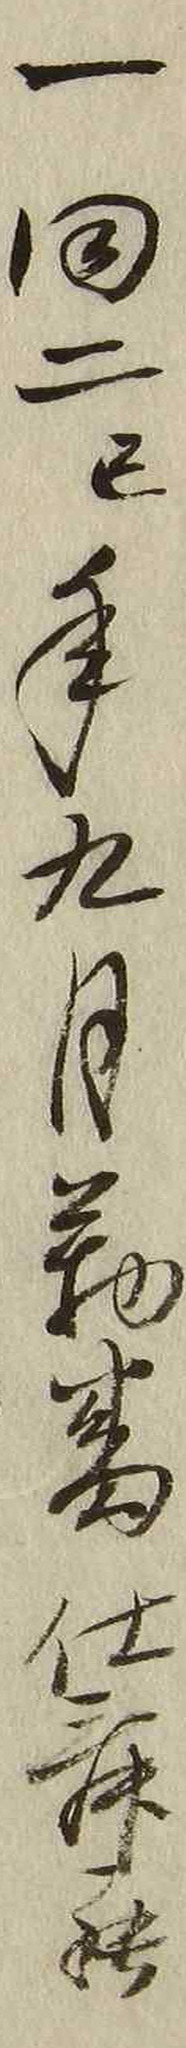一同二巳年九月勤番仕舞罷
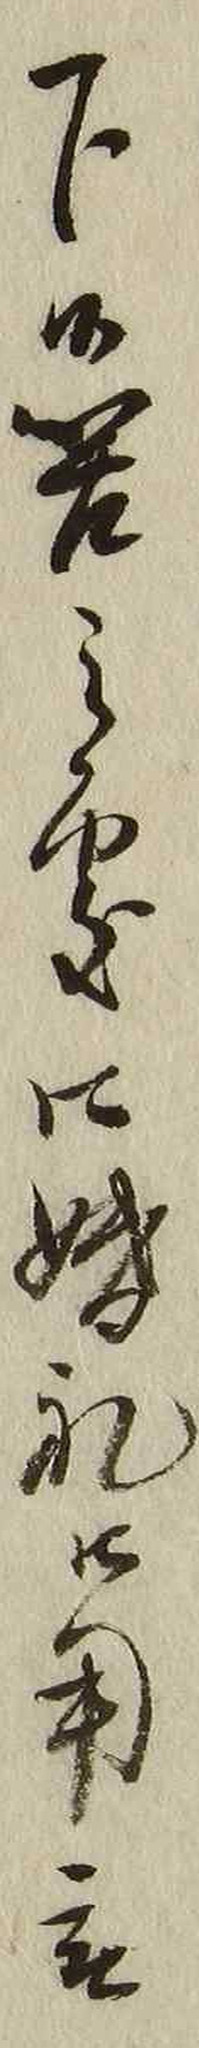下候筈之処御婚礼御用被
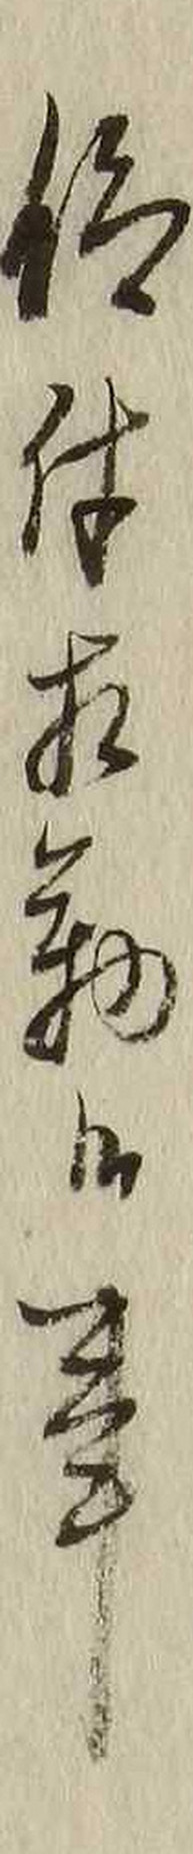仰付相勤候事
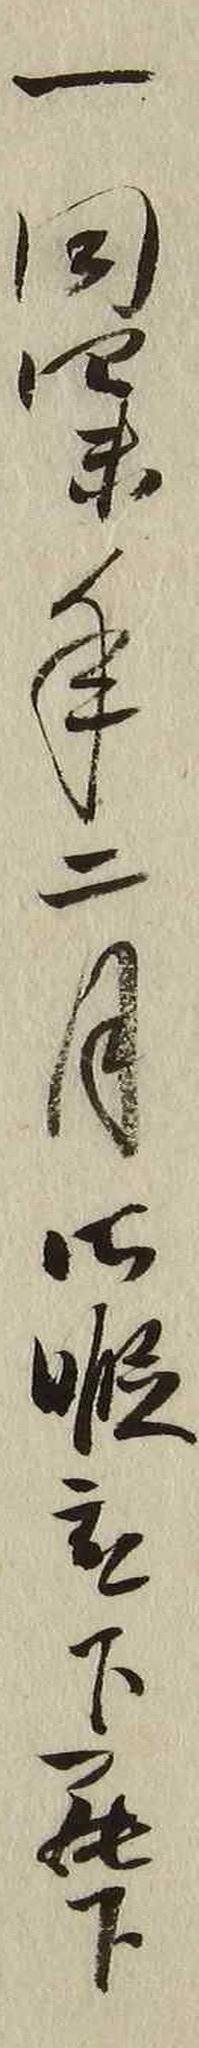一同四未年二月御暇被下罷下
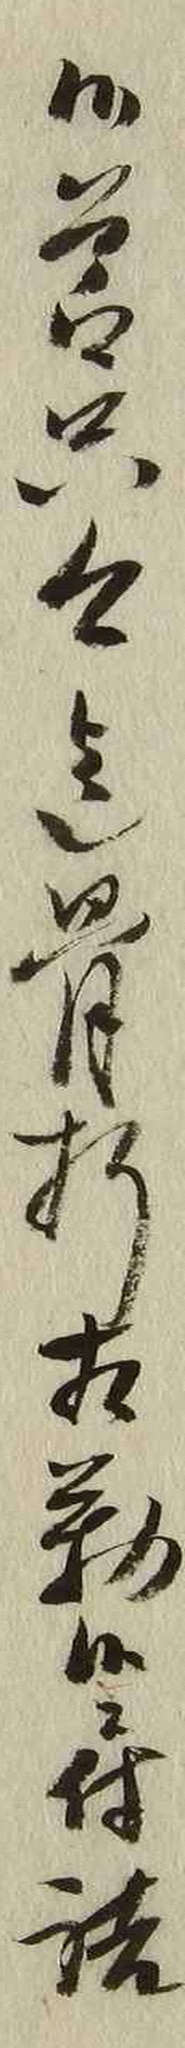候節只今迄骨折相勤候ニ付諸
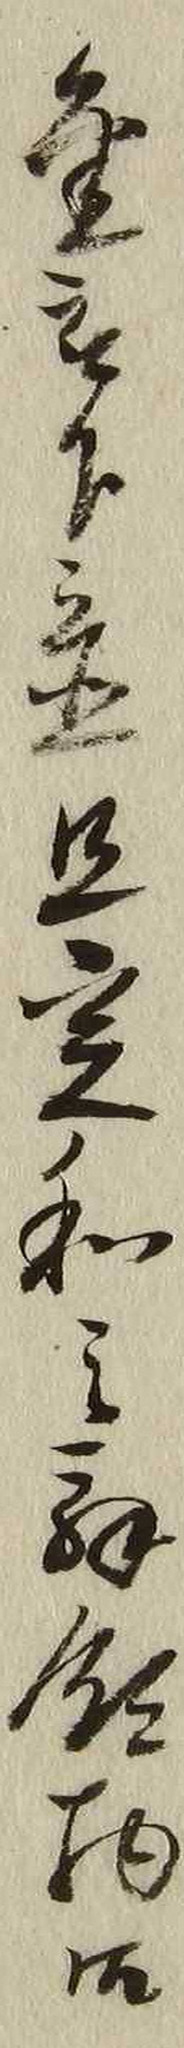金被下置且定和之拝領物御
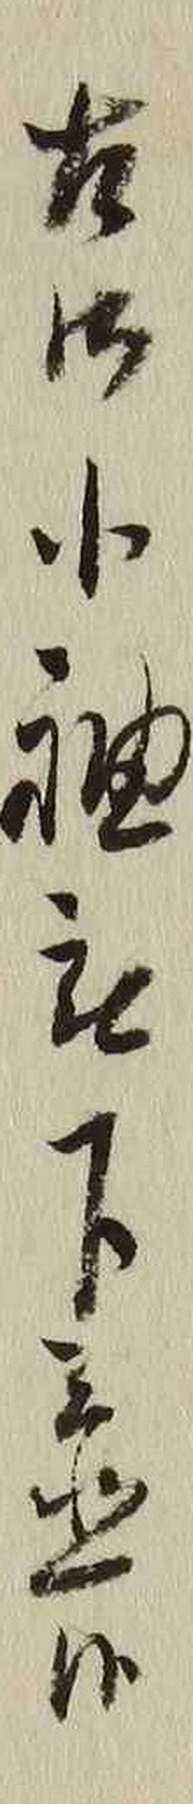古御小袖被下置候
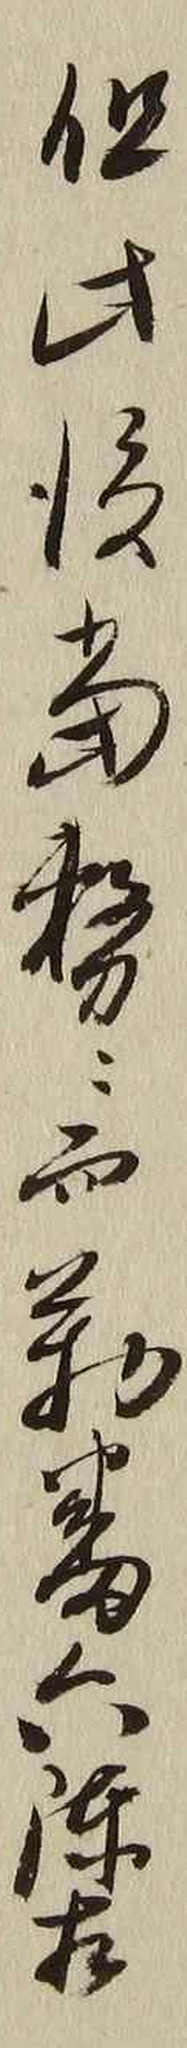但此後当務ニ而勤番六陣相
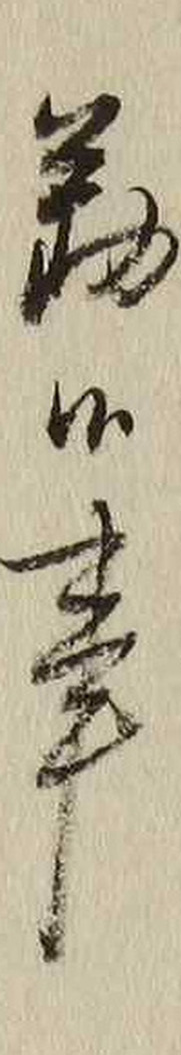勤候事
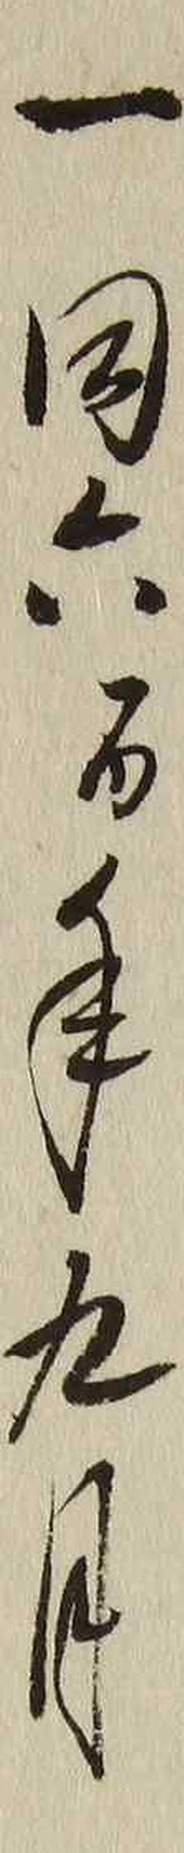一同六酉年九月
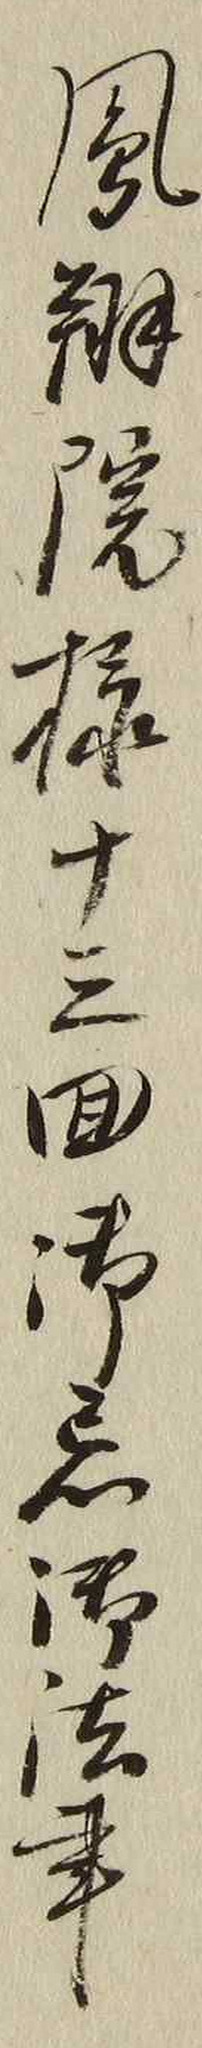鳳翔院様十三回御忌御法事
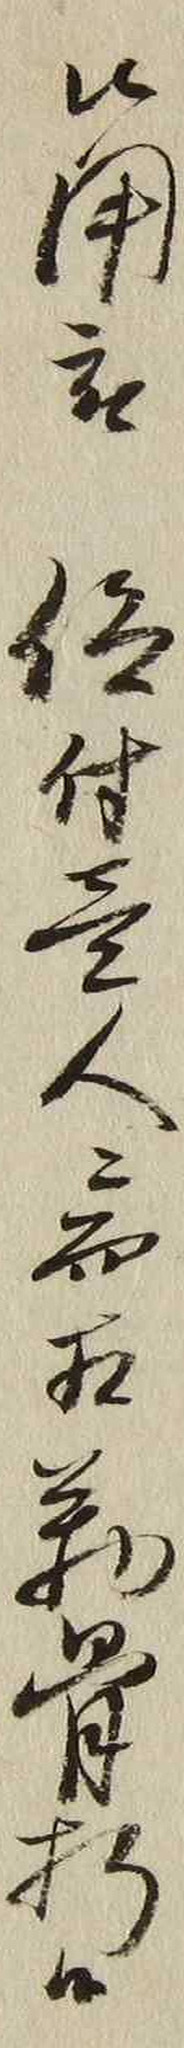御用被仰付壱人ニ而相勤骨折候
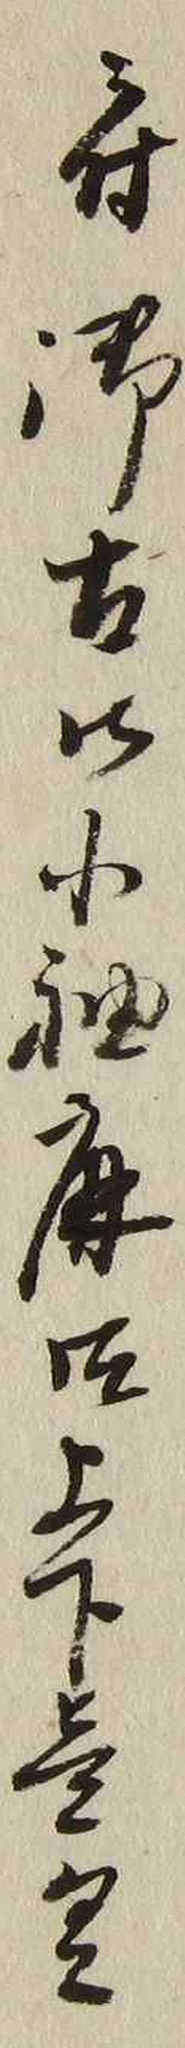ニ付御古御小袖麻御上下壱具
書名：諸士系譜　巻之355　す之部5
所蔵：会津若松市立会津図書館
